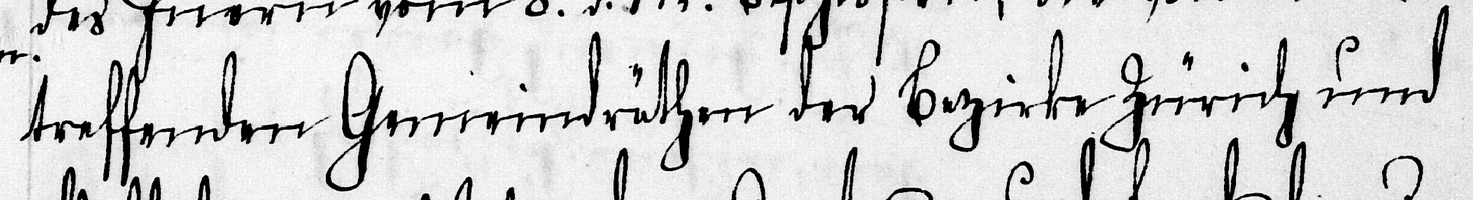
treffenden Gemeindräthen der Bezirke Zürich und
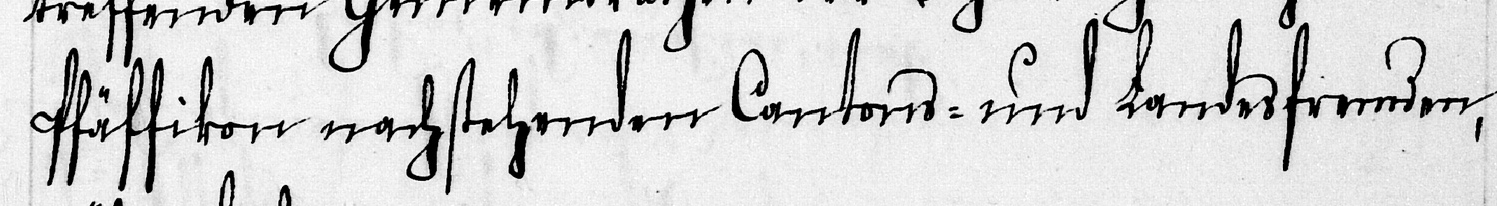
Pfäffikon nachstehenden Cantons- und Landesfremden,
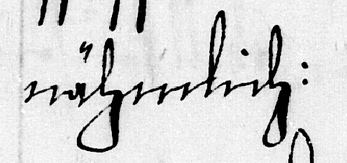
nähmlich:
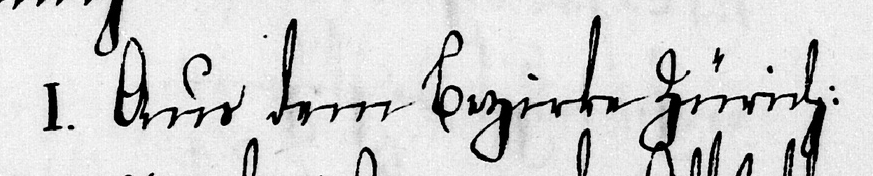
I. Aus dem Bezirke Zürich:
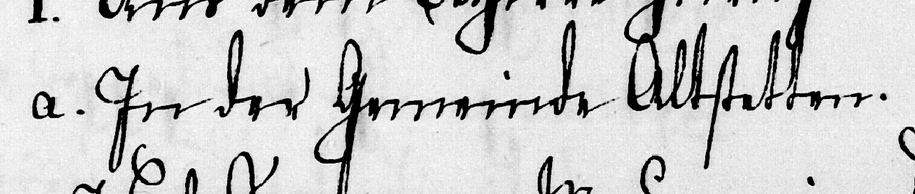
a. In der Gemeinde Altstetten.
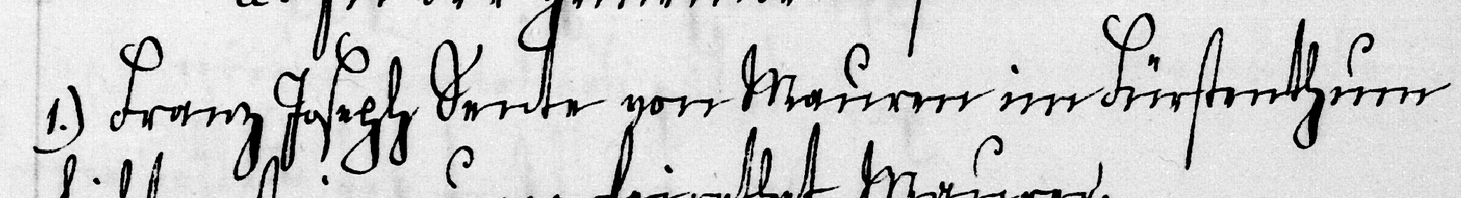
1.) Franz Joseph Sente von Mauren im Fürstenthum
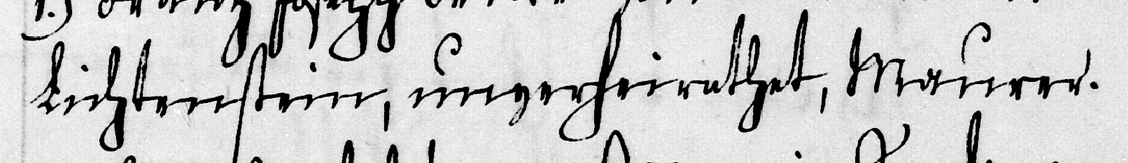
Lichtenstein, unverheirathet, Maurer.
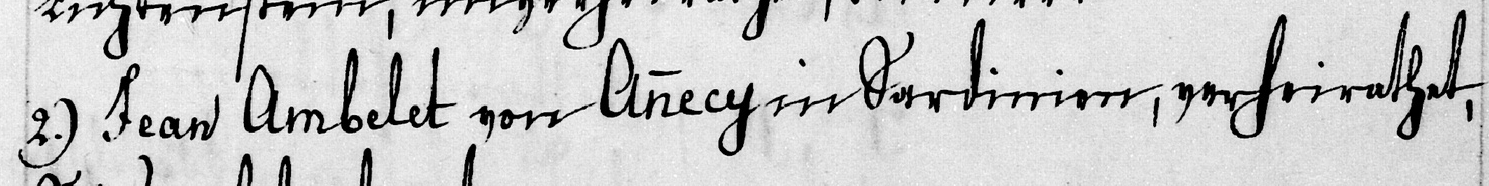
2.) Jean Ambelet von Annecy in Sardinien, verheirathet,
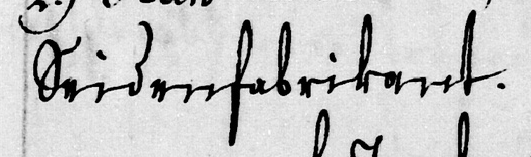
Seidenfabrikant.
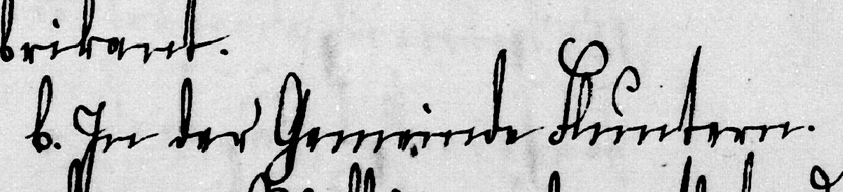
b. In der Gemeinde Fluntern.
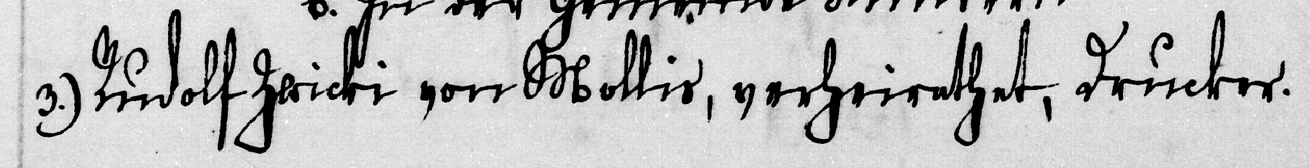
3.) Rudolf Zwicki von Mollis, verheirathet, Drucker.
